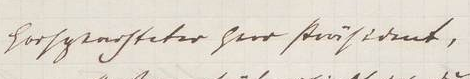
Hochgeachteter Herr Präsident,
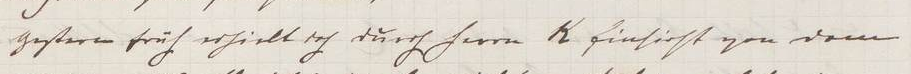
Gestern früh erhielt ich durch Herrn K Einsicht von dem
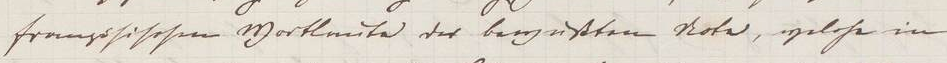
französischen Wortlaute der bewußten Note, welche in
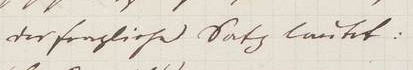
Der fragliche Satz lautet:
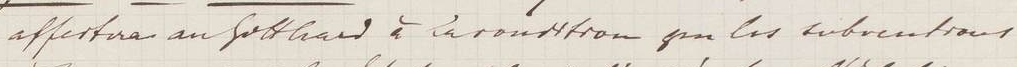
affectera au Gotthard à la condition que les subventions
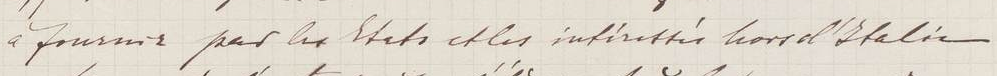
a Tourine par les Etats et les intéressés hors d'Italie
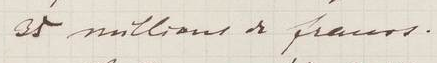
35 millions de francs.»
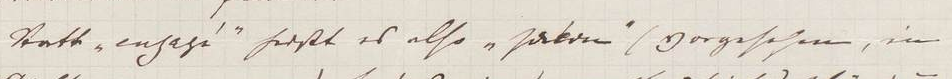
Statt «engagé» heißt es also «prévu» (vorgesehen, in
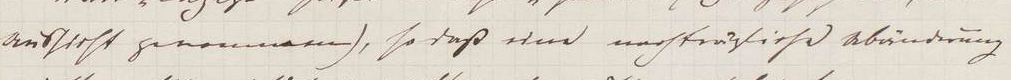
Aussicht genommen), so daß eine nachträgliche Abänderung
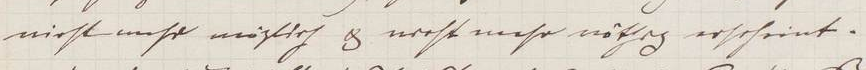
nicht mehr möglich & nicht mehr nöthig erscheint.
